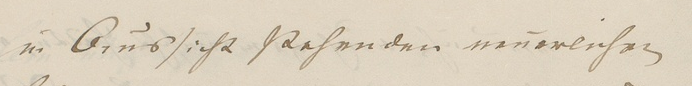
in Aussicht stehenden neuerlichen
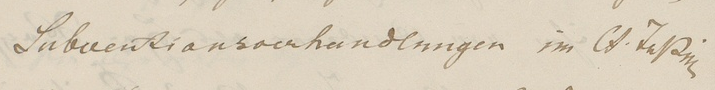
Subventionsverhandlungen im Ct. Teßin
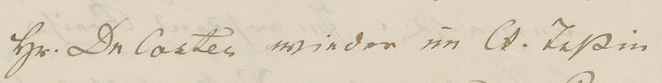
Hr. Du Coster wieder im Ct. Teßin
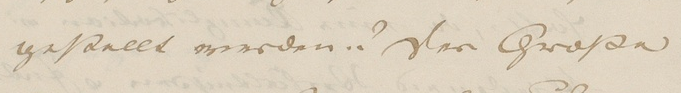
gestellt werden.? Der Grosse
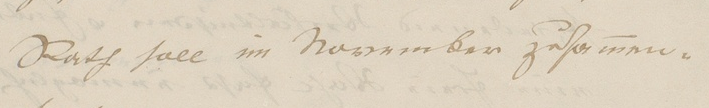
Rath soll im November zusammen-
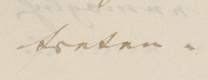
treten.
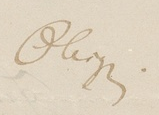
Obiger.
